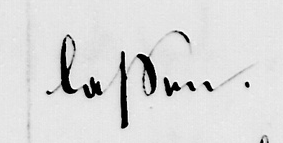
lassen.
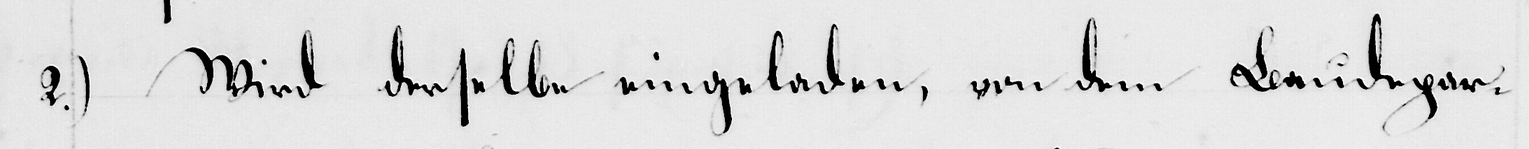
2.) Wird derselbe eingeladen, von dem Baudepar¬
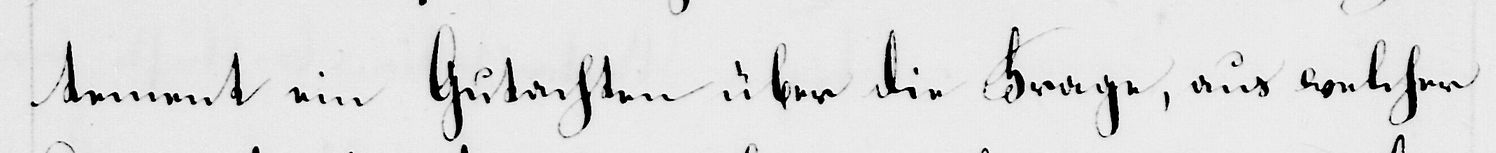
tement ein Gutachten über die Frage, aus welcher
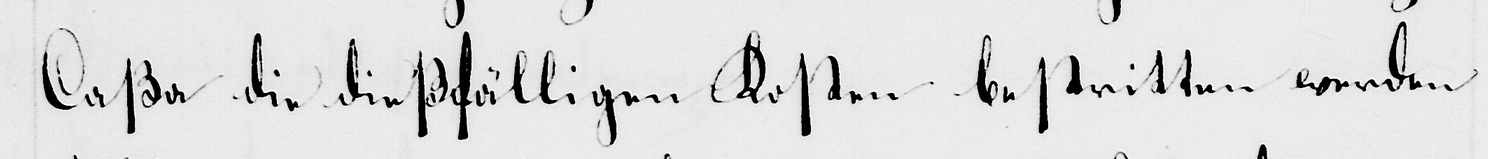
Caßa die dießfälligen Kosten bestritten werden
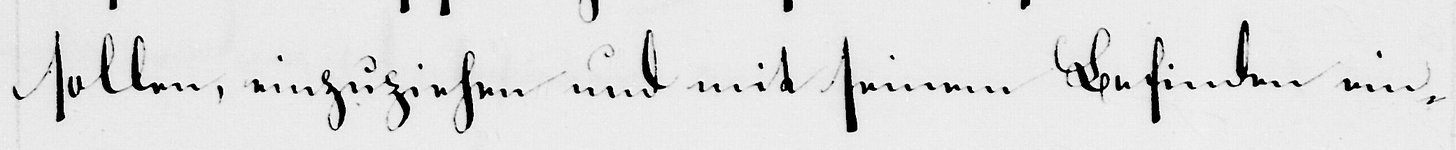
sollen, einzuziehen und mit seinem Befinden ein¬
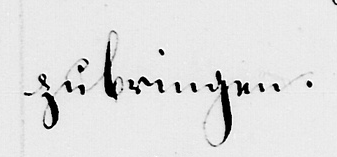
zubringen.
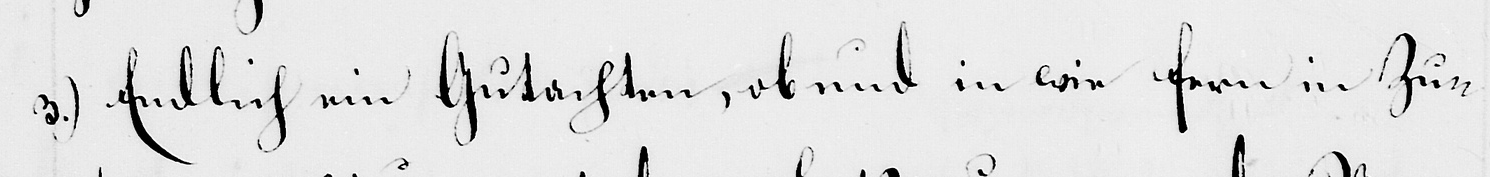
3.) Endlich ein Gutachten, ob und in wie fern in Zu¬
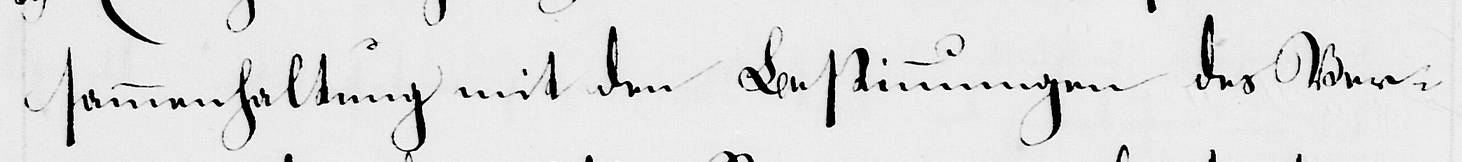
sammenhaltung mit den Bestimmungen des Ver¬
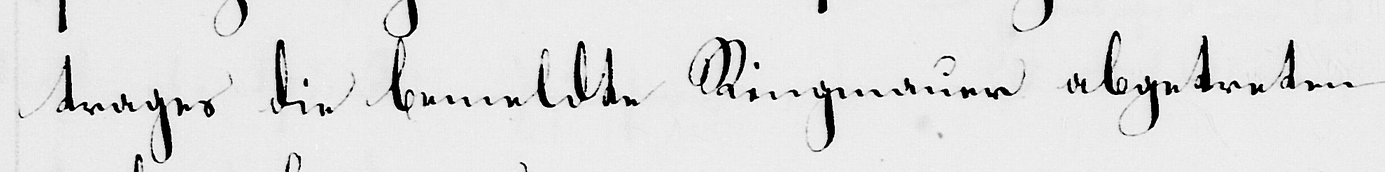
trages die bemeldte Ringmauer abgetreten
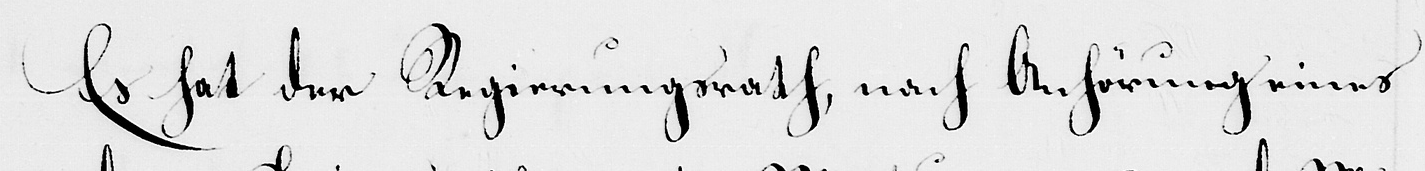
Es hat der Regierungsrath, nach Anhörung eines
